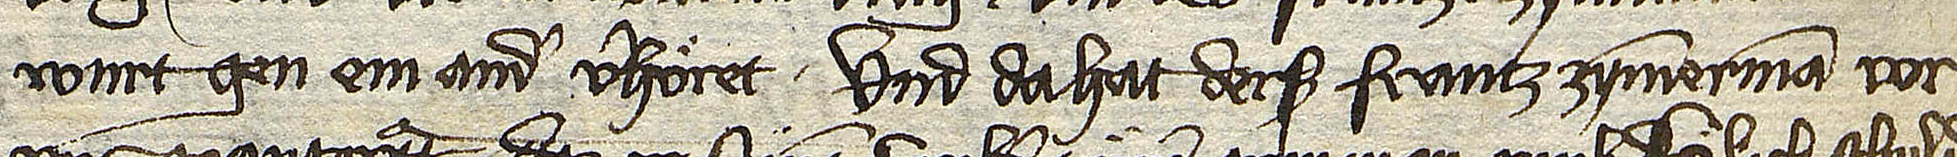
wurt gen ein and* v*höret / Vnd da hat derſ* francʒ ʒym*erma* vor
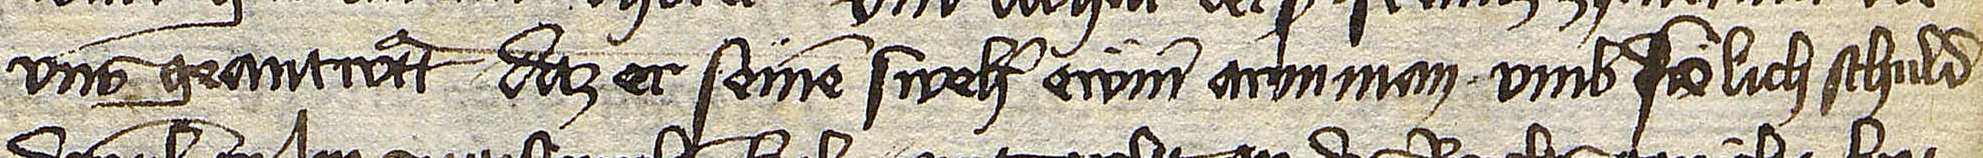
vns geantw*tt / daʒ er ſeine* ſweh* eẅm* armman . vmb ſölich ſchuld
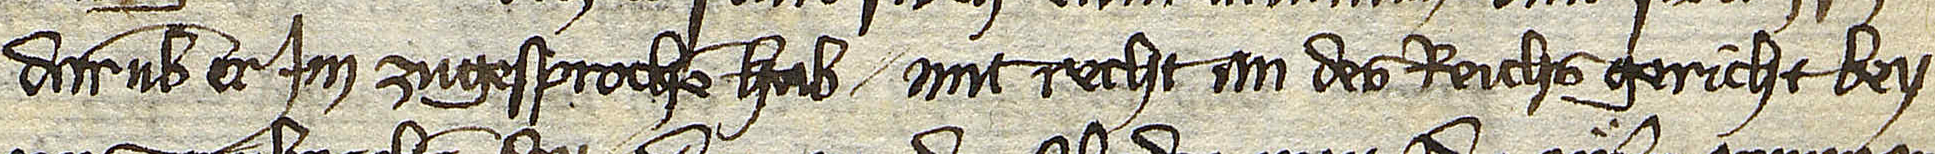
darub* er Im ʒugeſproche* hab / mit recht an des Reichs gericht bey
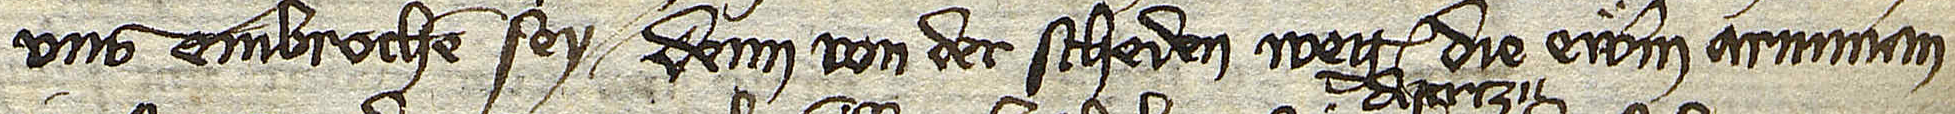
vnd einbroche* ſey / Denn von der ſcheden weg* die eẅ*m armman
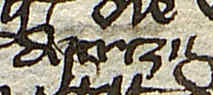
darcʒu
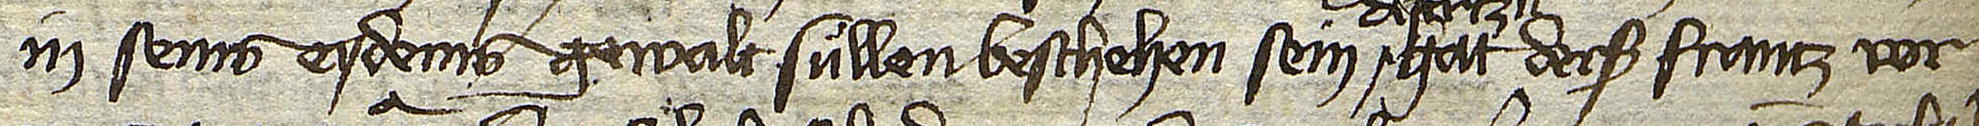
in ſeins eydems gewalt ſüllen beſchehen ſein hat derſ* francʒ vor
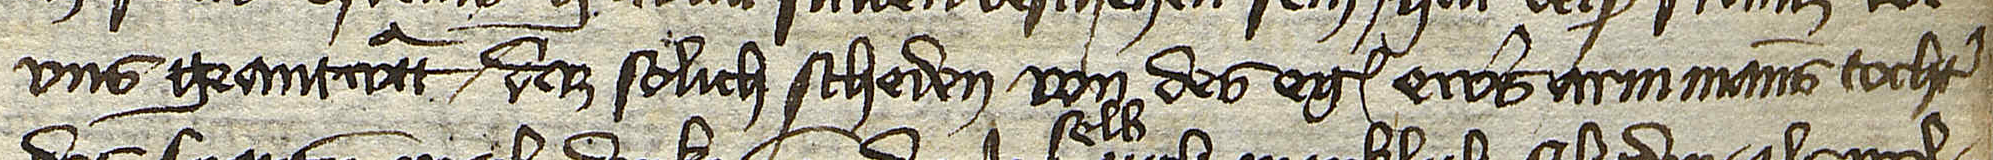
vns geantw*tt / daʒ ſölich ſcheden von des eg* ew*s arm man*s tocht*
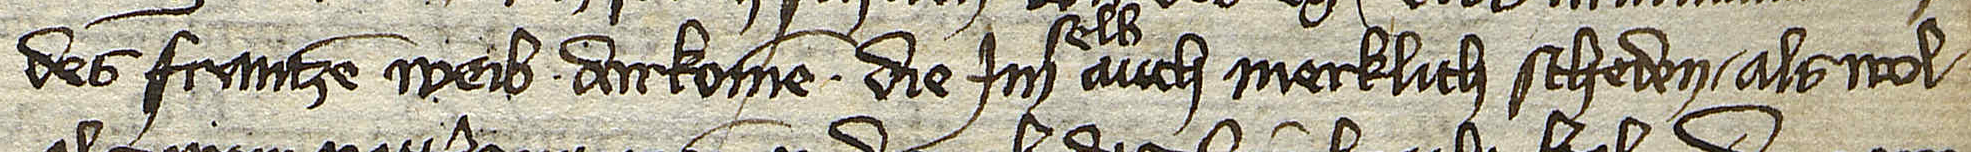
des francʒe* weib darkome* . die Im auch merklich ſcheden / als wol
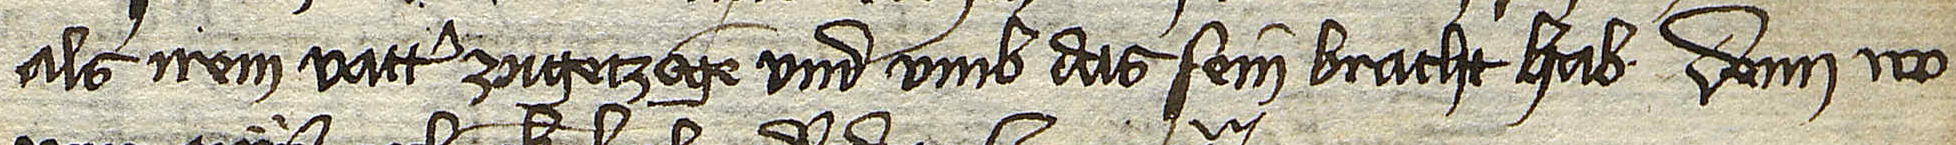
als irem vatt* ʒugecʒoge* vnd vmb das ſein bracht hab . Denn wo
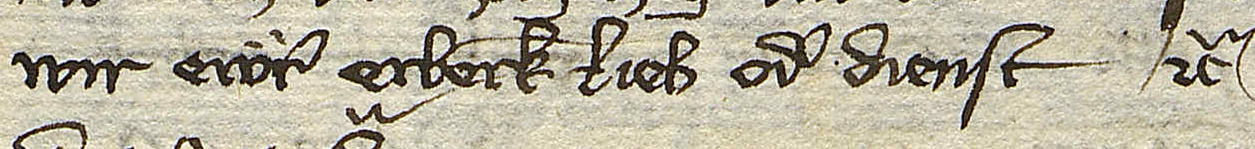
wir eẅr* erberk* lieb od* dienſt ec*
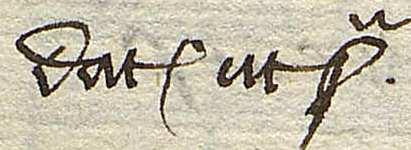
Dat* ut ſ*
